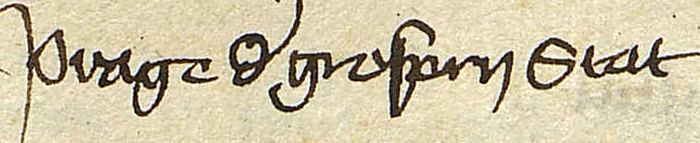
Prage d* groſʒern Stat
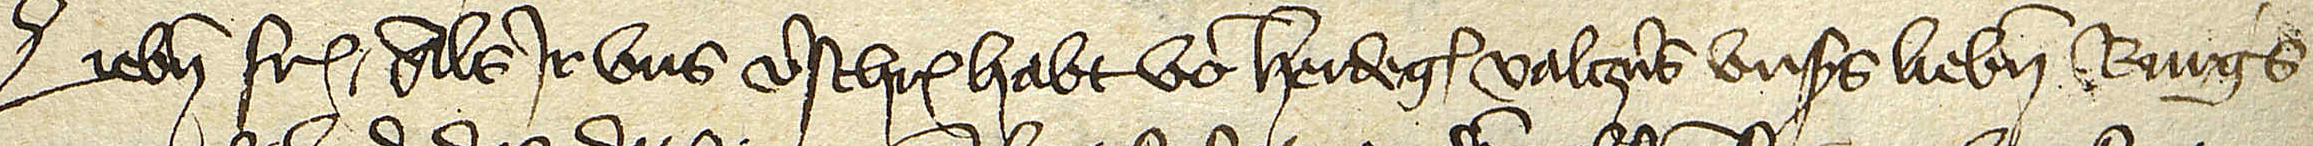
Liebn* fr* / Als Ir vns v*ſchr* habt vo* herdeg* valcʒn*s vnſ*s liebn* Burg*s
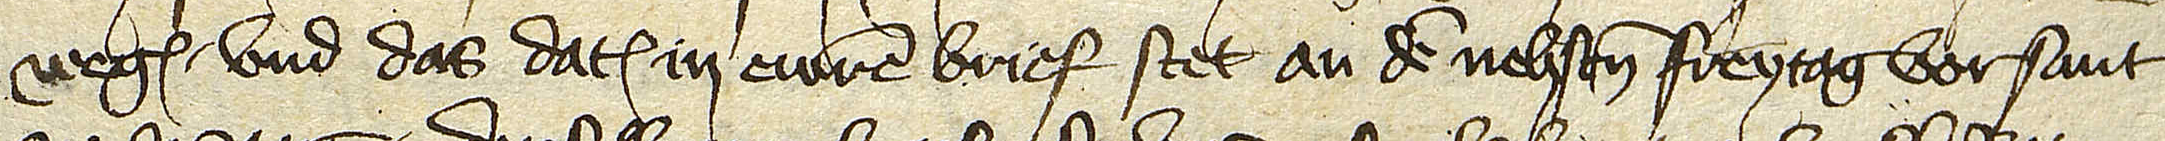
weg* / vnd das dat* in ewre* brief ſtet an d* nehſtn* freytag vor ſant
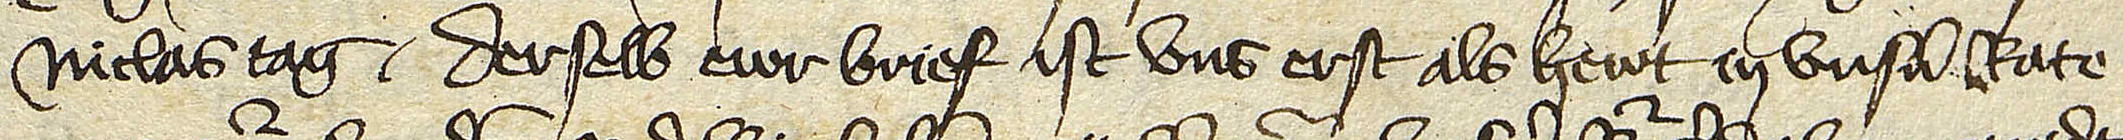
Niclas tag / derſelb ewr brief iſt vns erſt als hewt in vnſn* Rate
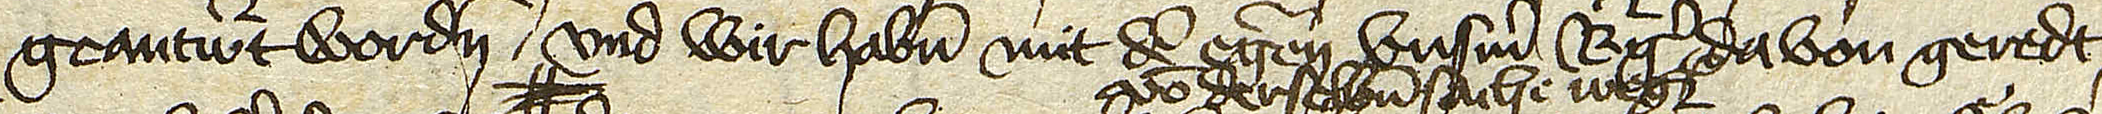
geantw*t wordn* / vnd wir habn* mit d* egen* vnſm* B*g* davon geredt
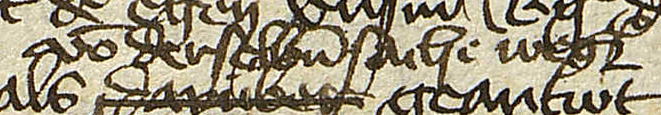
vo* derſelbn* ſache weg*
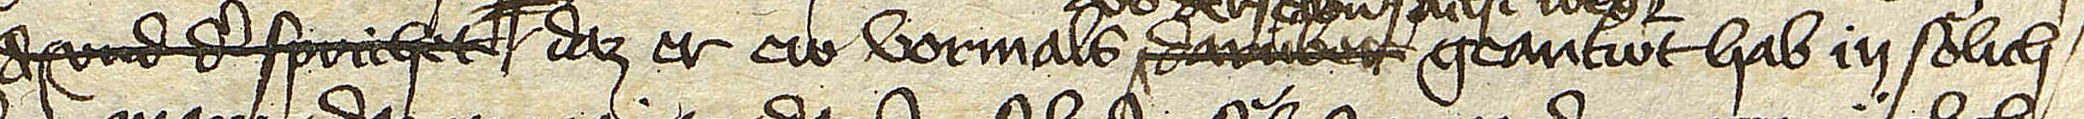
d vnd d* ſprichet / daʒ er ew vormals darüber geantw*t hab in ſölich*
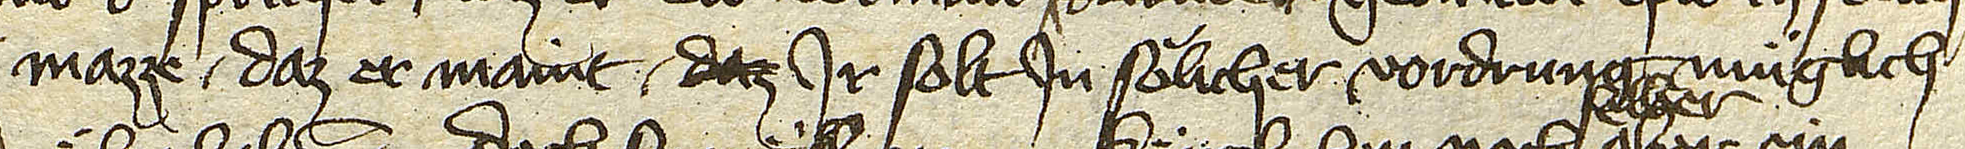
maʒʒe / daʒ er maint / daʒ Ir ſolt In ſölicher vordrung müglich
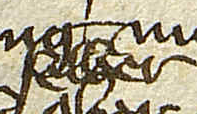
ſelber
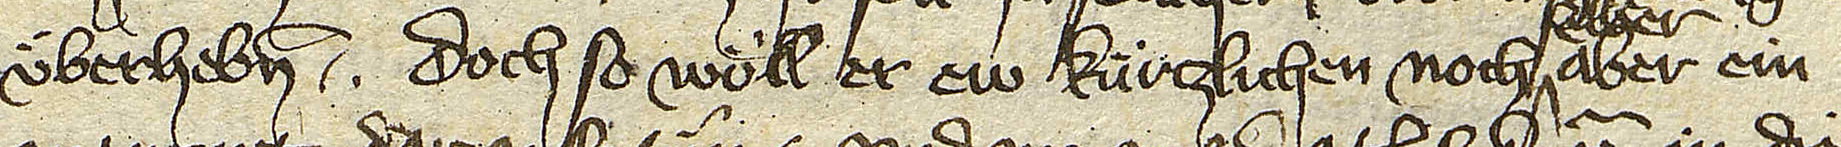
überhebn* / . Doch ſo wöll er ew kürcʒlichen noch aber ein
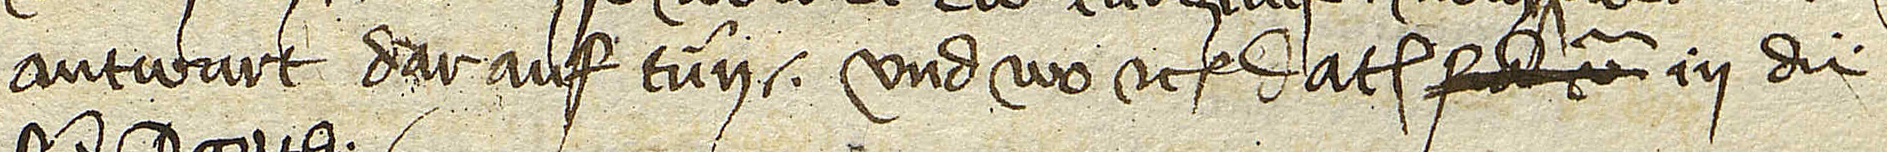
antwurt dar auf tün / . vnd wo ec* dat* fia* v* in die
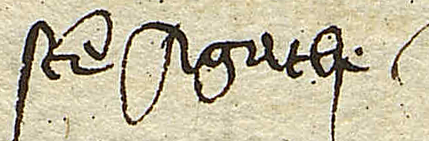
ſce* Agathe /
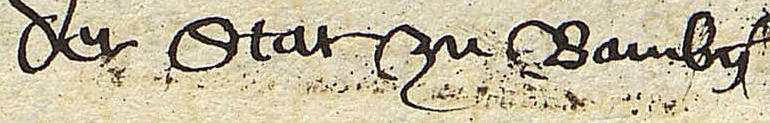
der Stat cʒu Bambg*
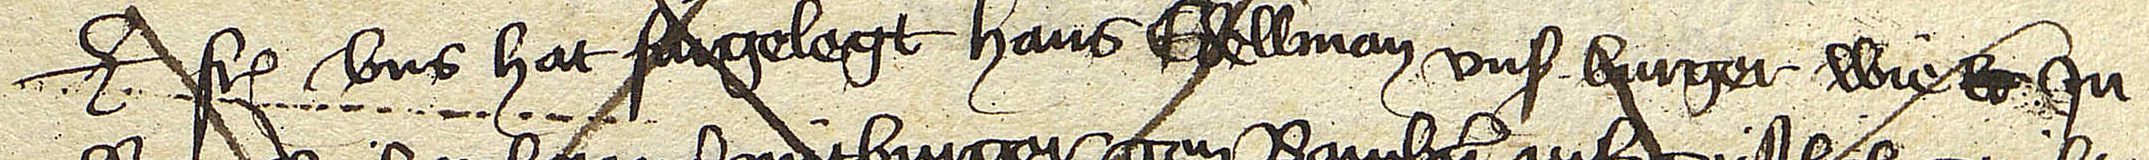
L* fr* / vns hat fürgelegt hans Edellman vnſ* burger / wie Er In
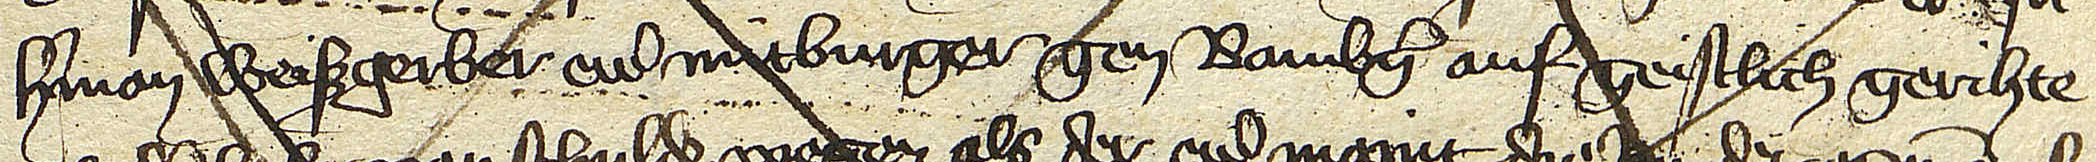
h*man weiſʒgerber ew* mitburger gen Bambg* auf geiſtlich gerihte
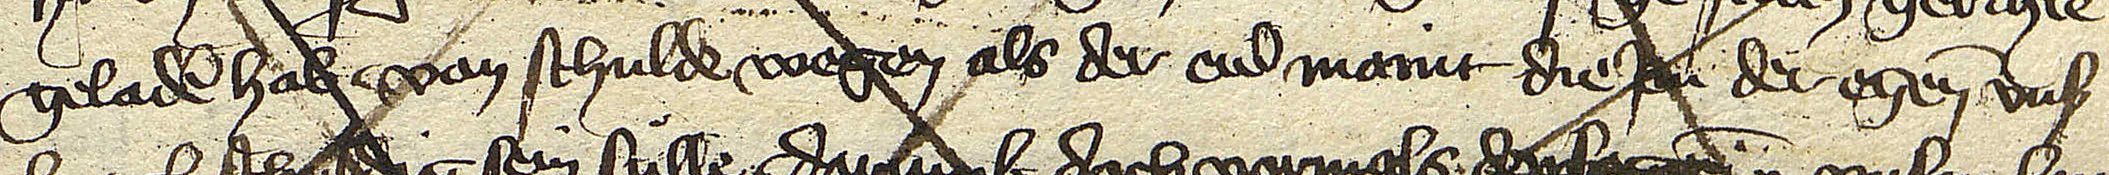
gelade* hab / von ſchulde wegen als der ew* maint die Im der egen* vnſ*
